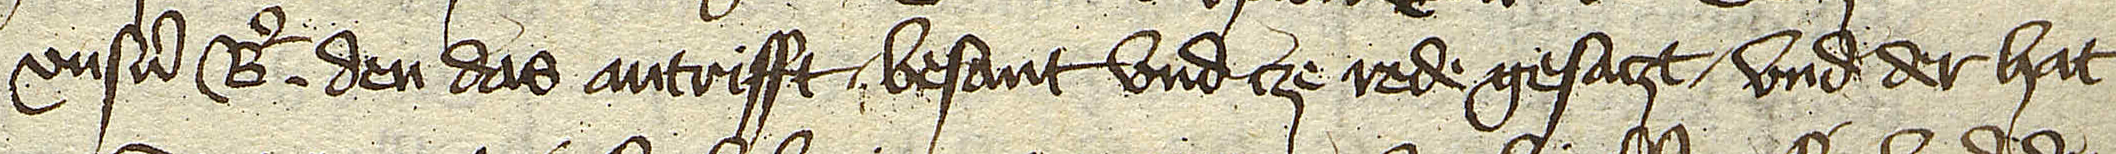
vnſn* B* . den das antrifft / beſant vnd cʒe rede geſacʒt / vnd der hat
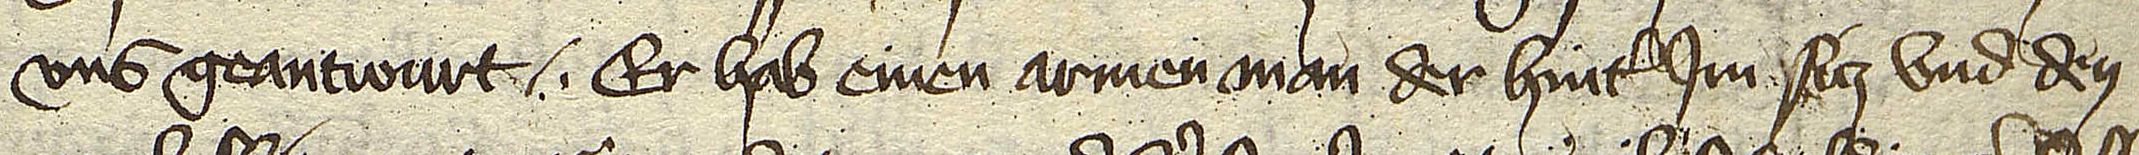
vns geantwurt / . Er hab einen armen man der hint* Im ſicʒ vnd den
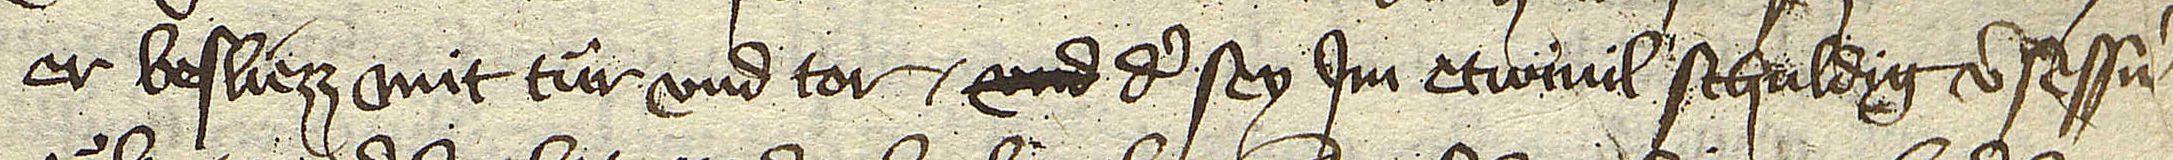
er beſlieʒʒ mit tür vnd tor / vnd d* ſey Im etwieuil ſchuldig v*ſeſſn*
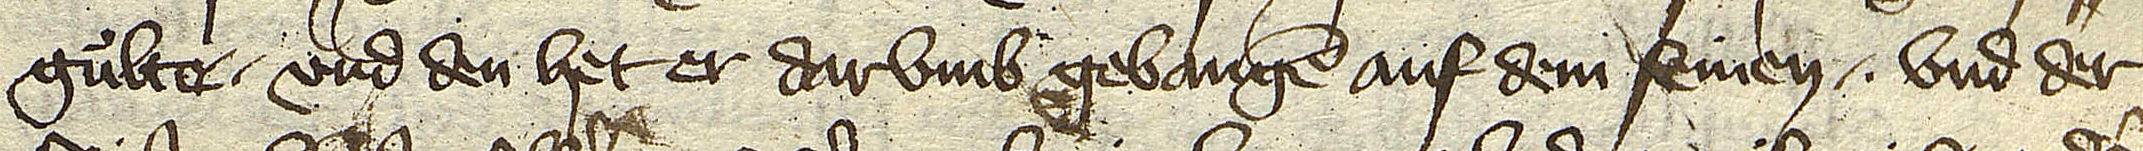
gülte / vnd den het er darvmb gevange* auf dem ſeinen / . vnd der
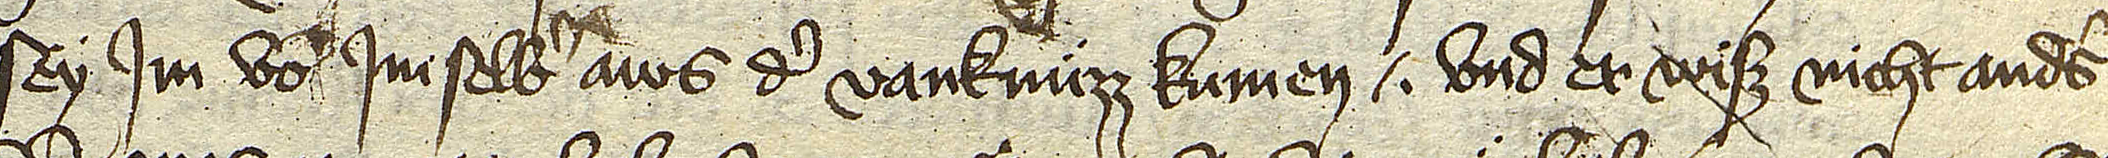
ſey Im vo* Im ſelb* aws d* vanknüʒʒ kumen / . vnd er wiſʒ nicht ands*
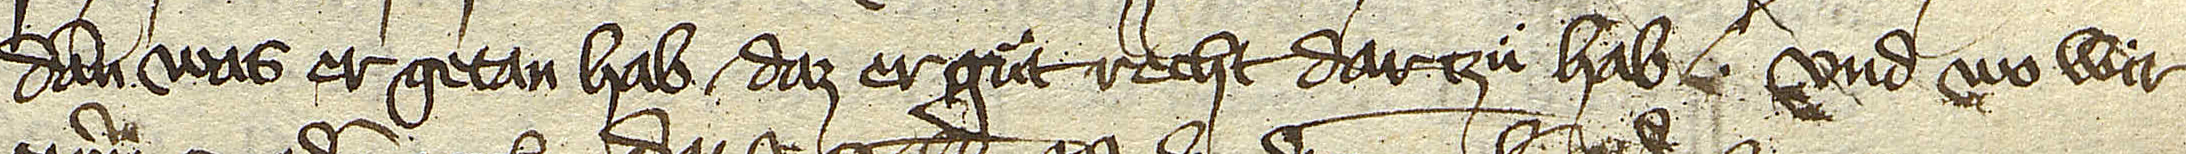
dan* was er getan hab / daʒ ergüt recht darcʒü hab / . vnd wo wir
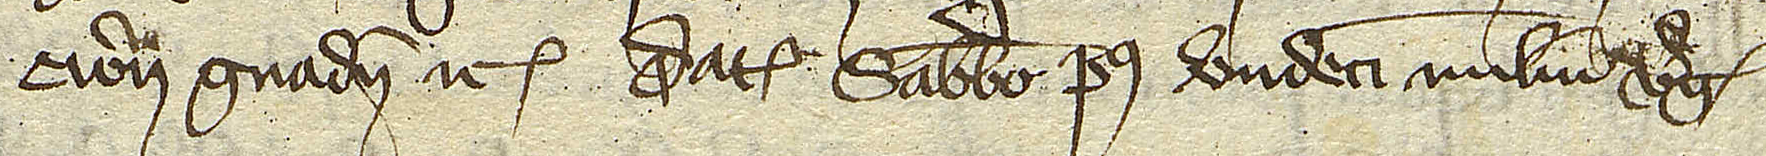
ew*n gnadn* ec* Dat* Sabbo* p* vndeci* miliu* vg*
